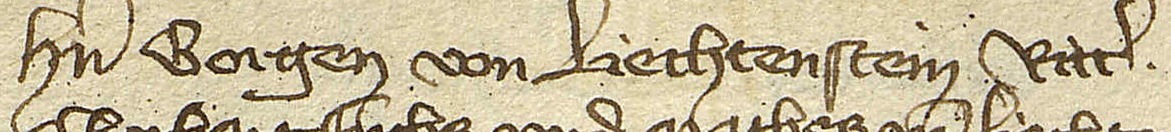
hn* Gorgen von Liechtenſtein Ritt* .
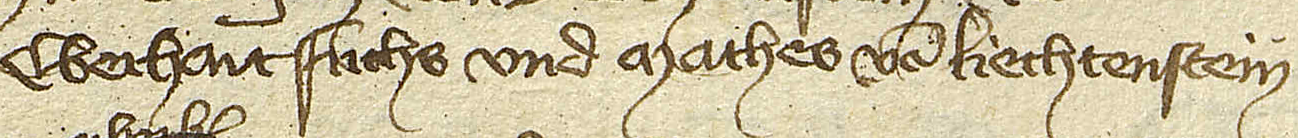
Eberhart Fuchs vnd Mathes vo* liechtenſtein
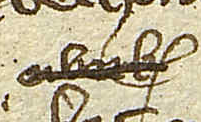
erberk*
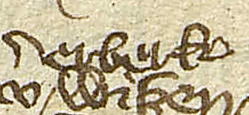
erberk*
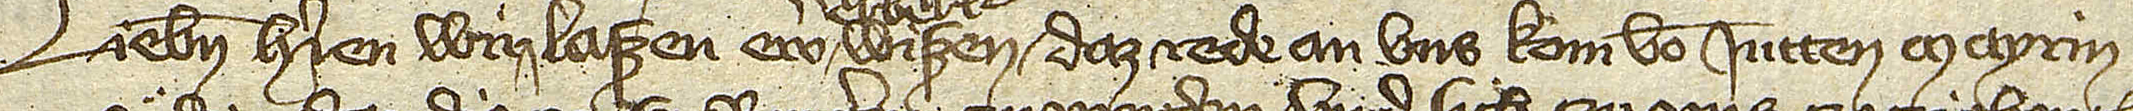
Liebn* h*ren wir laſʒen ew* wiſʒen / daʒ rede an vns köm* vo* Iutten Mayrin
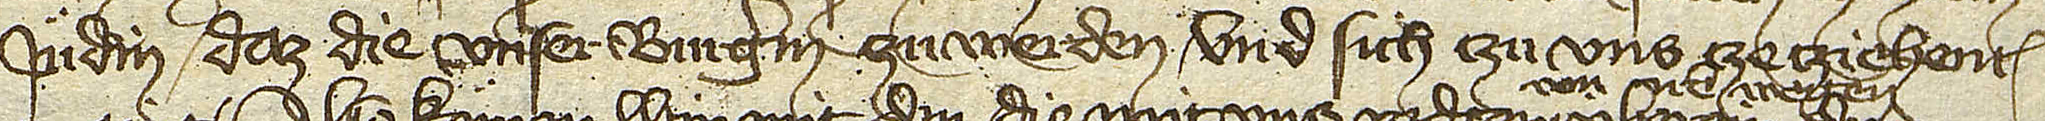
Iüdin / daʒ die vnſer Burg*in cʒuwerden / vnd ſich cʒu vns cʒe cʒiehent*
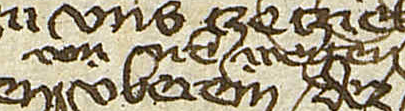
von ire* wegen
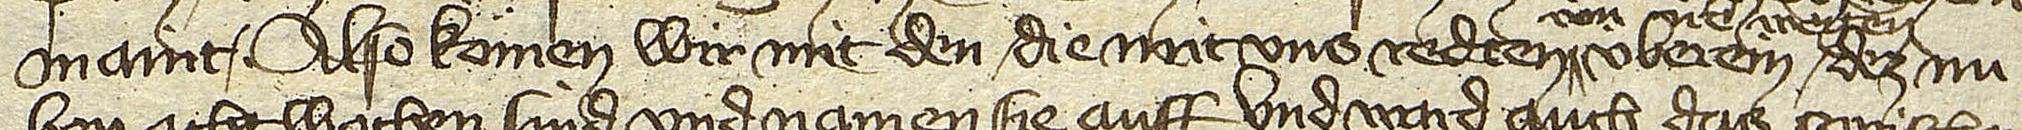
maint / . Alſo kömen wir mit den / die mit vns redten v̈berein / deʒ nu
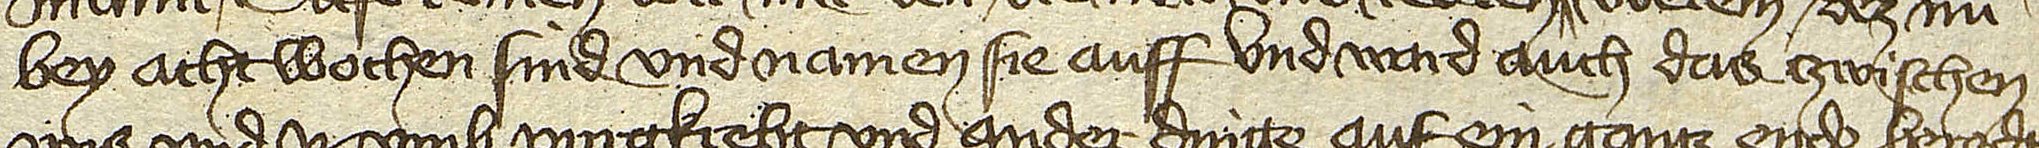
bey acht wochen ſind vnd namen ſie auff vnd ward auch das cʒwiſchen
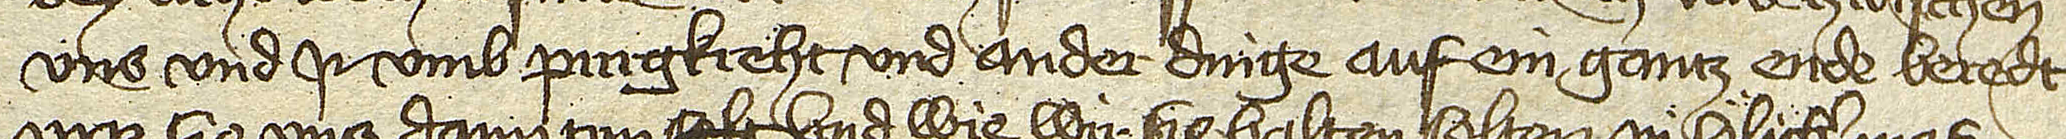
vns vnd Ir vmb purgkreht vnd ander dinge auf ein gancʒ ende beredt
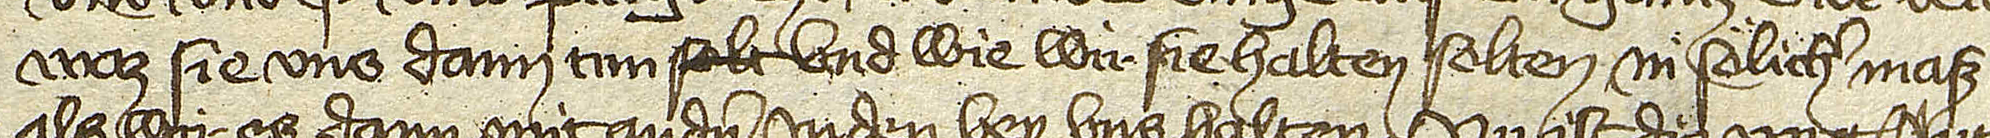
waʒ ſie vnd dann tun ſolt vnd wie wir ſie halten ſolten in ſölich* maſʒ
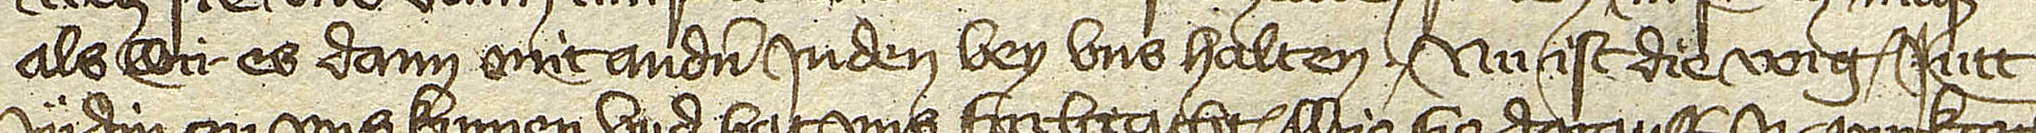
als wir es dann mit andn* Iuden bey vns halten . / Nu iſt die vorg* Iutt*
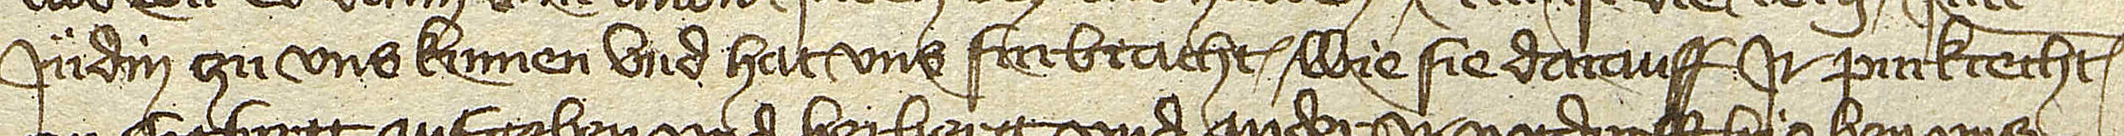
Iüdin cʒu vns kumen vnd hat vns furbracht / wie ſie darauff Ir purkrecht*
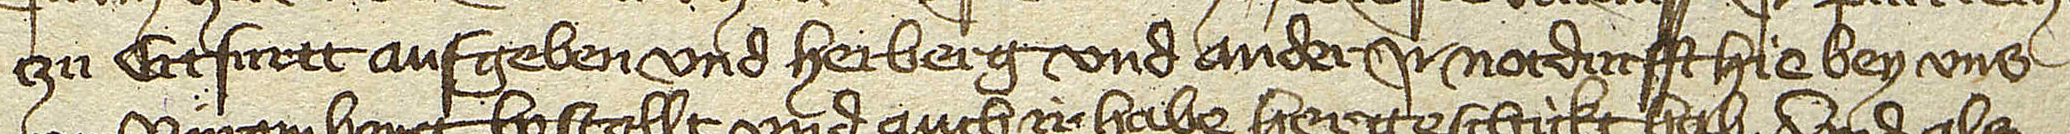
cʒu Erfurtt aufgeben vnd herberg vnd ander Ir notdurfft hie bey vns
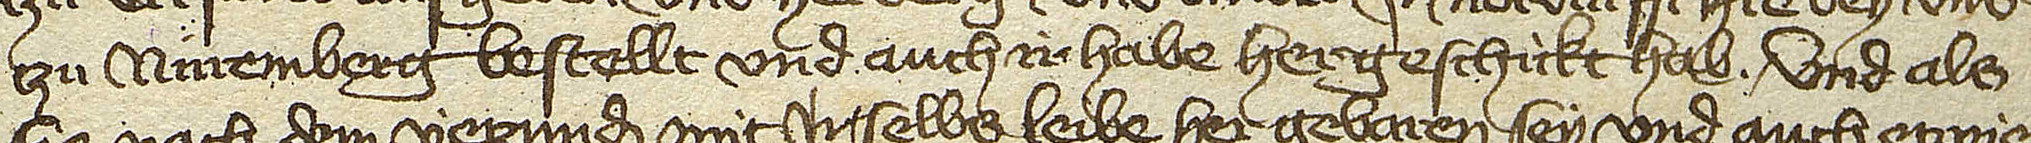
cʒu Nüremberg beſtellt vnd auch ir habe hergeſchickt hab . / Vnd als
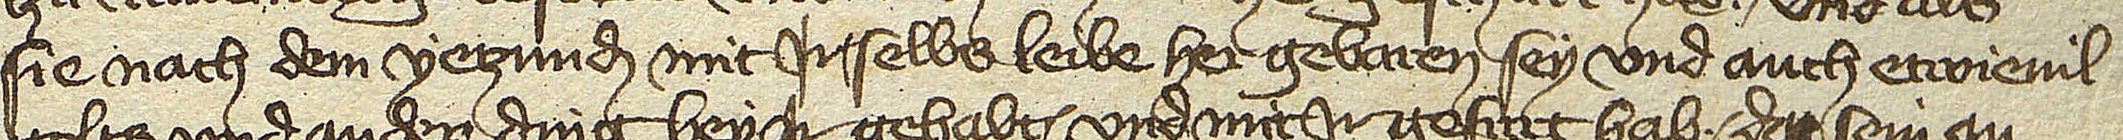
ſie nach dem yecʒund* mit Ir ſelbs leibe her gevaren ſey vnd auch etwieuil
